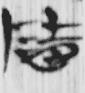○（隋）
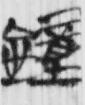鍾
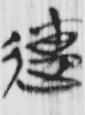連
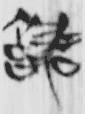囂
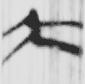大
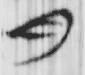月
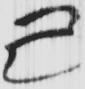己
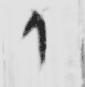人
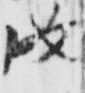戊
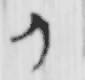人
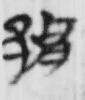○（宛）
